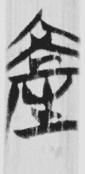產
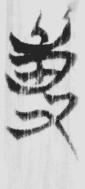尃
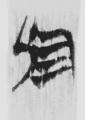於
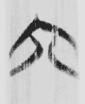六
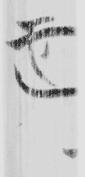正
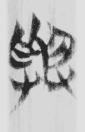與
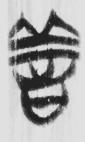善
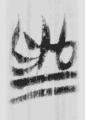爲
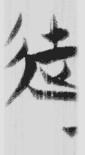徒
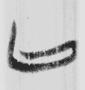㠯（以）
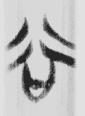谷
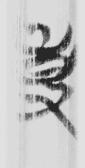事
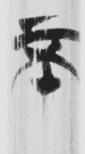不
